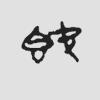既
